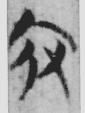府
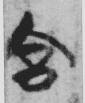宮
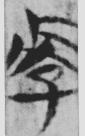李
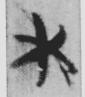木
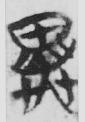異
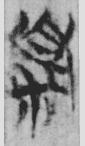類
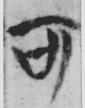可
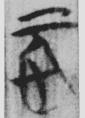{元心}（願）
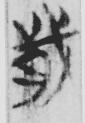歲
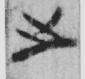之
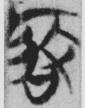啓
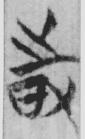時
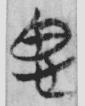思（使）
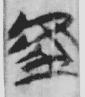𫊟（吾）
